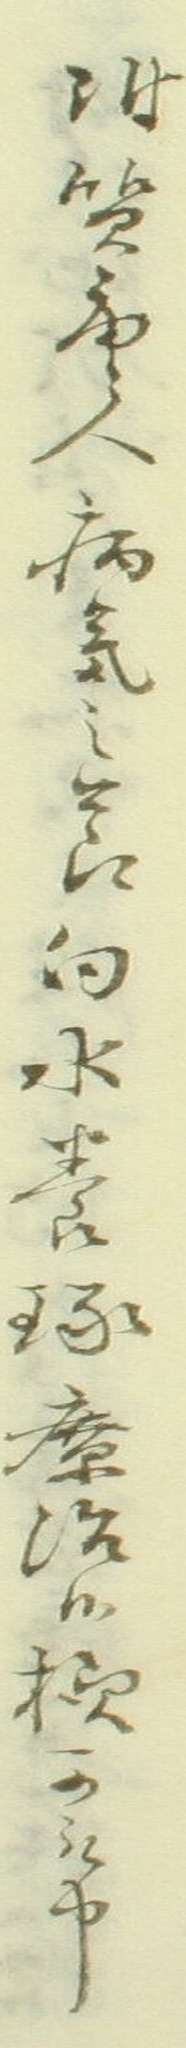附質唐人病気之節白水養琢療治候様可被申
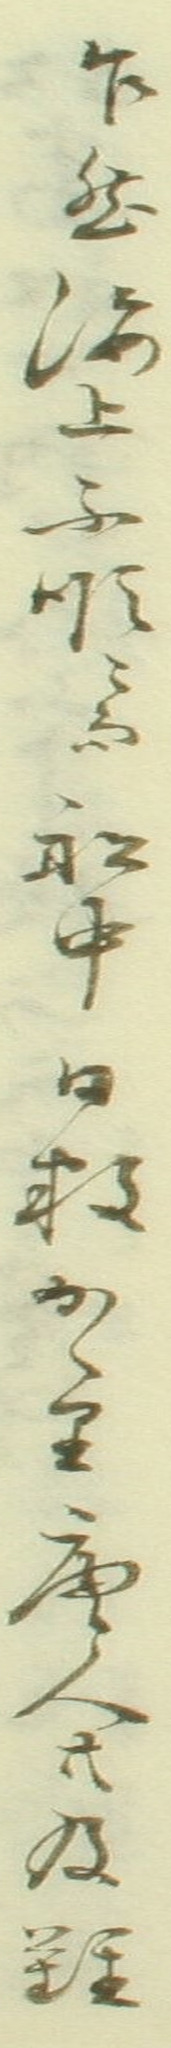乍然海上不順に而船中日数かかり唐人共及難
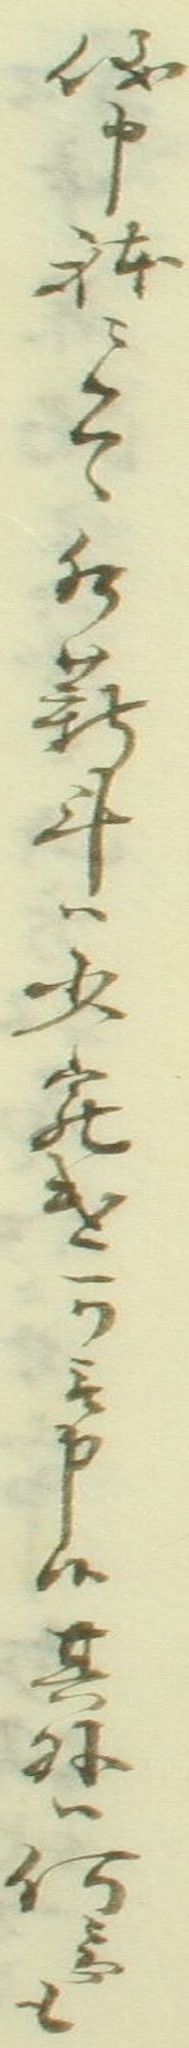儀申躰に候はゝ水薪計は少宛遣可被申候其外は何に而も
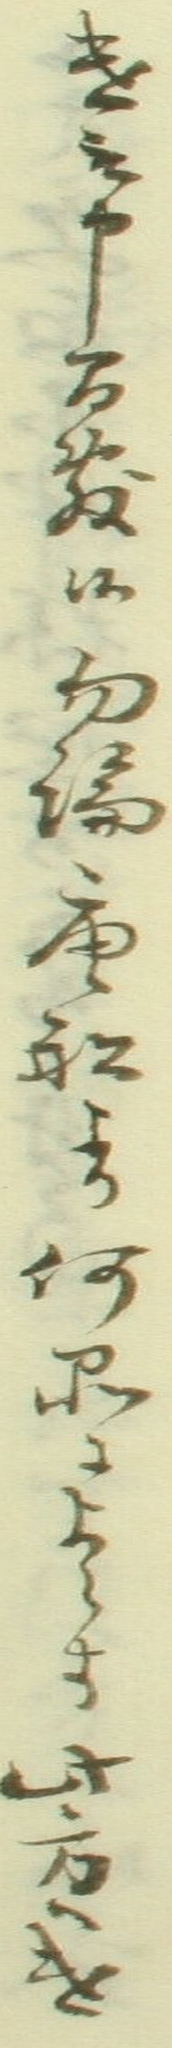遣被申間敷候勿論唐船より何品によらす此方へ遣

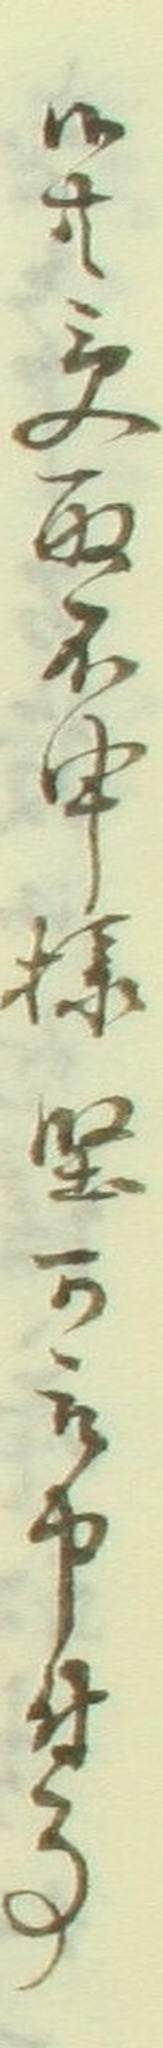候共受取不申様堅可被申付事
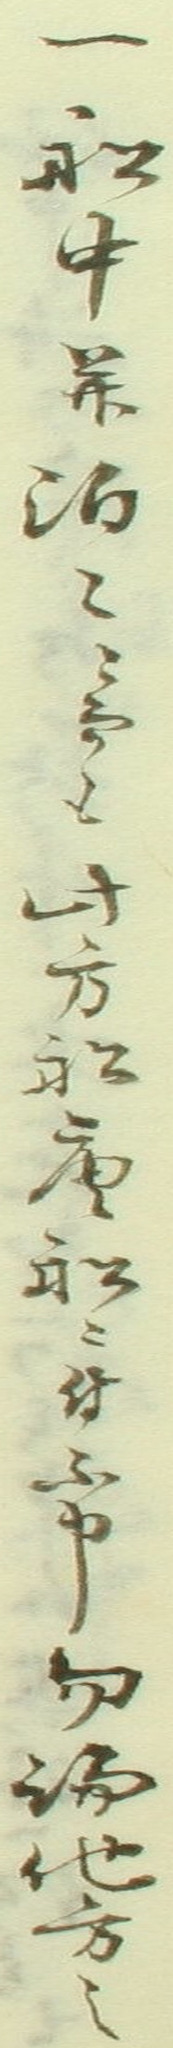一船中并泊々に而も此方船唐船に付不申勿論他方之
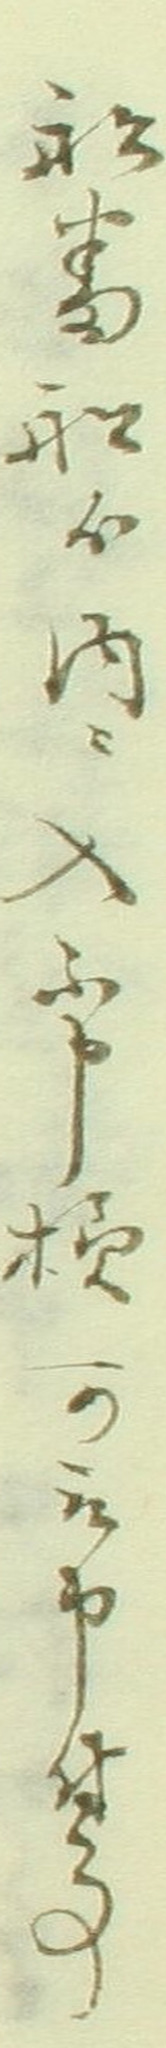船番船ゟ内に入不申様可被申付事
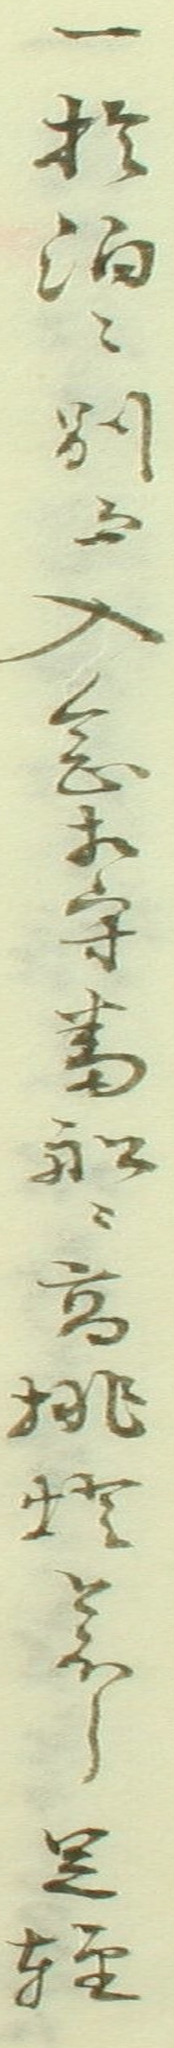一於泊々別而入念相守番船に高挑燈とほし足軽
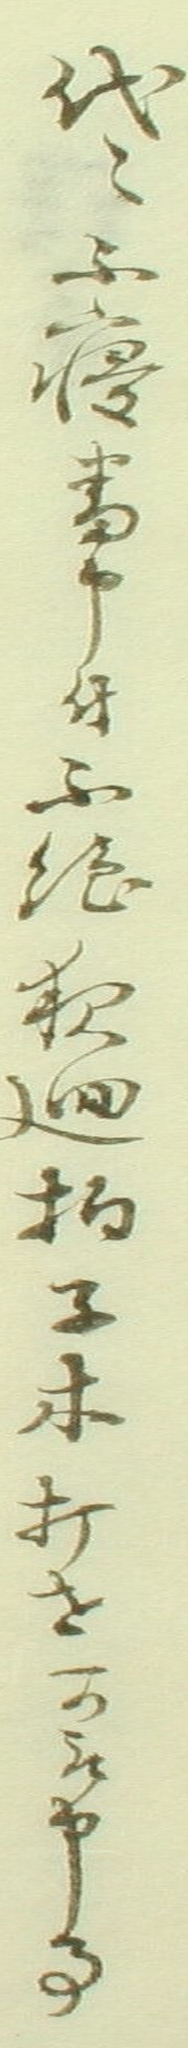代々不寝番申付不絶夜廻拍子木打せ可被申事
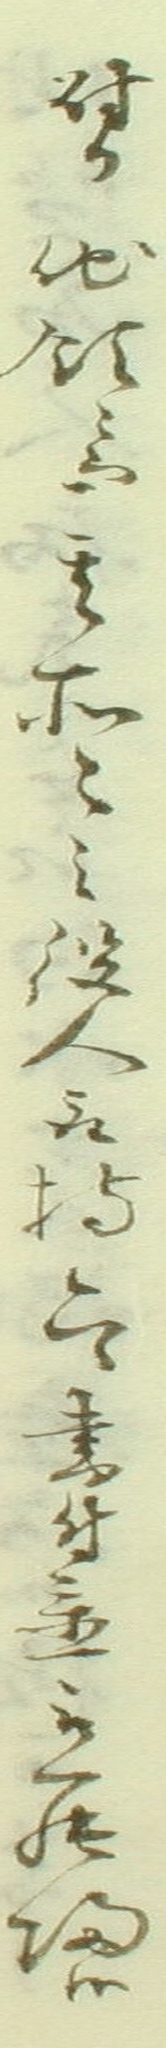付り他領に而其所々之役人取持候はゝ書付置被罷帰候
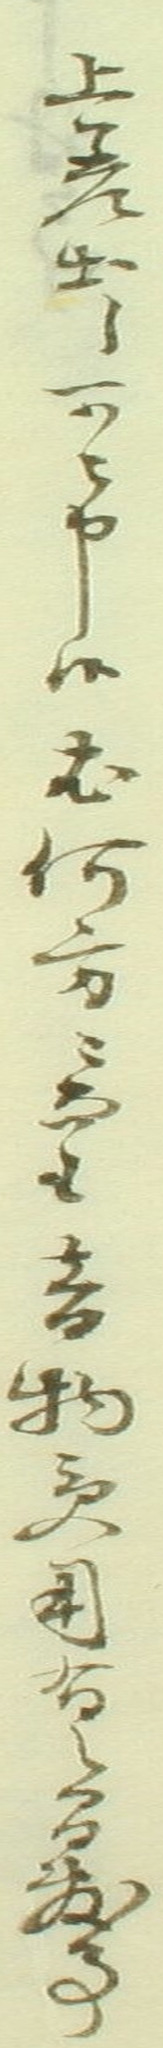上差出し可被申候尤何方に而も音物受用有之間敷事
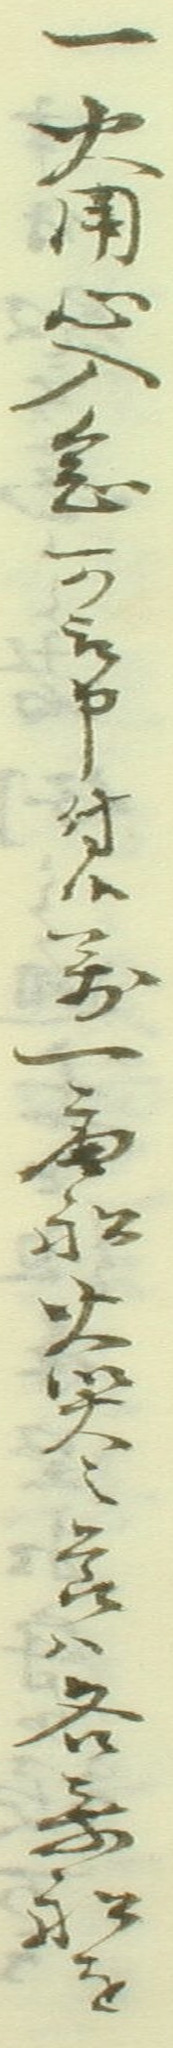一火用心入念可被申付候万一唐船火災之節は各乗船を
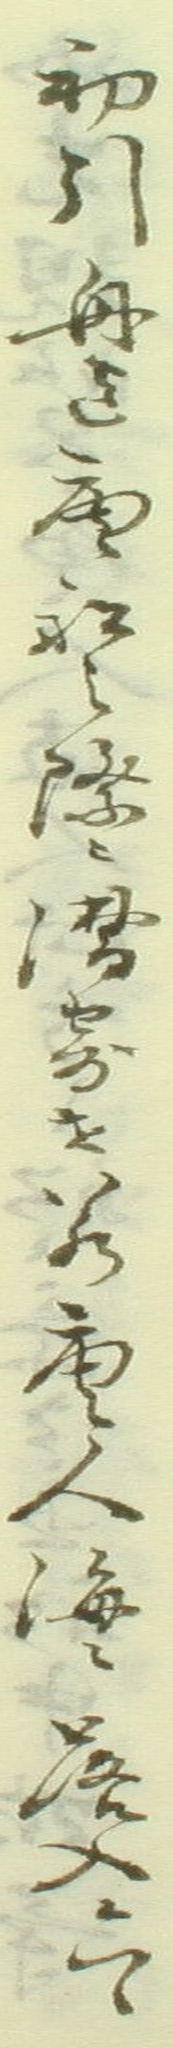初引舟迄唐船之際に漕寄せ若唐人海に落入候はゝ
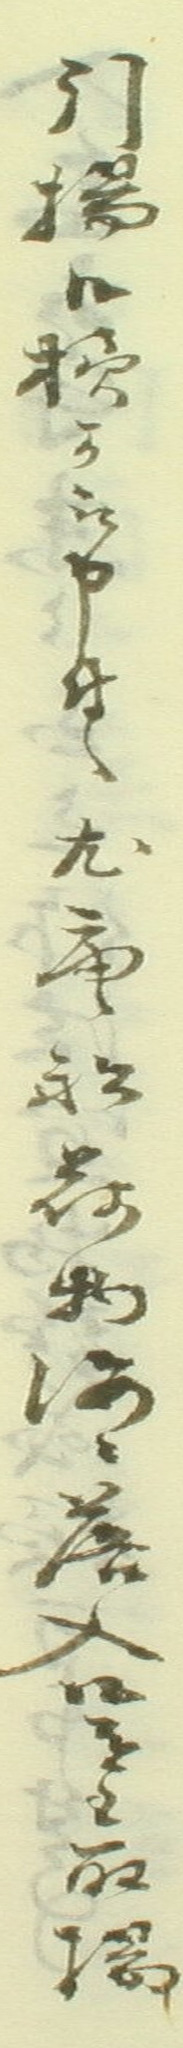引揚候様可被申付候尤唐船荷物海に落入候をも取揚
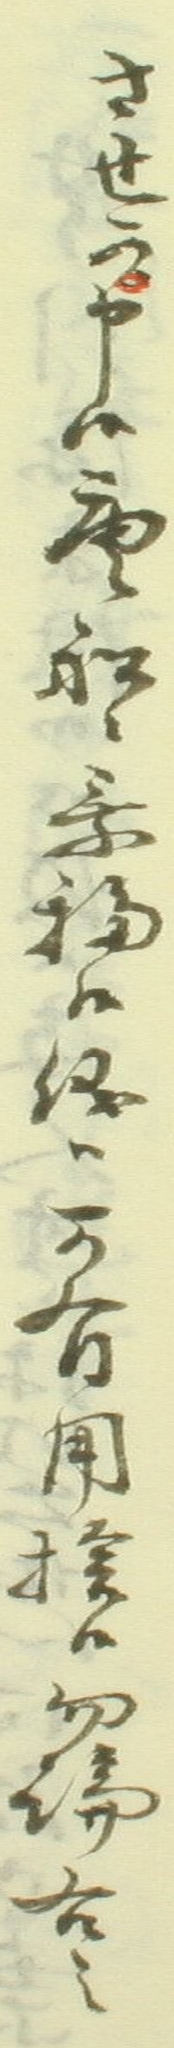させ可被申候唐船に乗移候儀は可有用捨候勿論右之
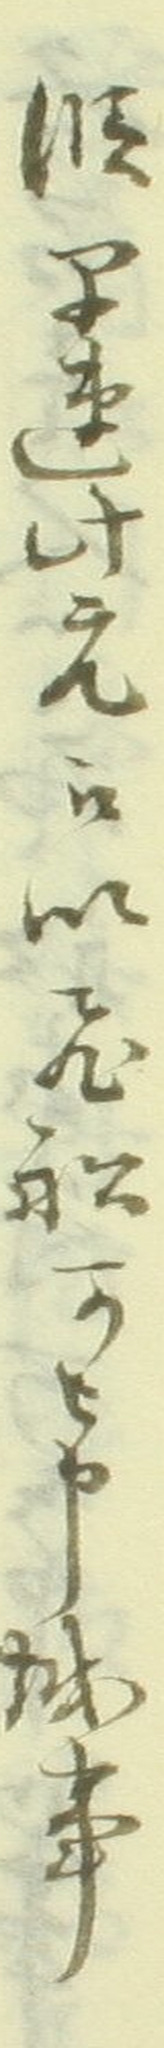段早速此元え以飛船可被申越事
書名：異国船漂着記
